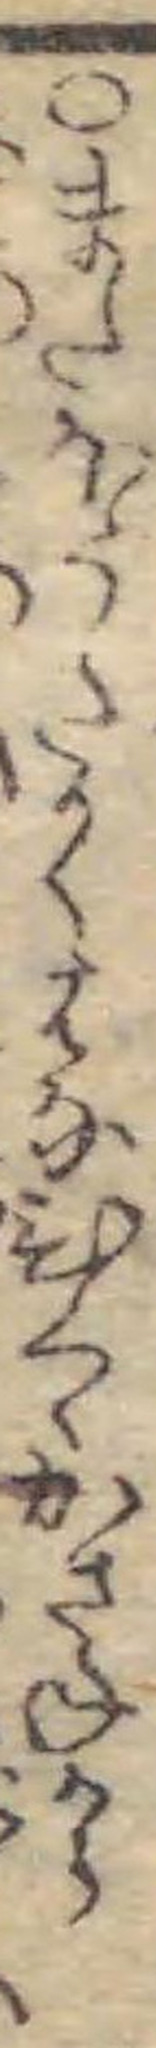○またほうたかくはなひくゝかさねから
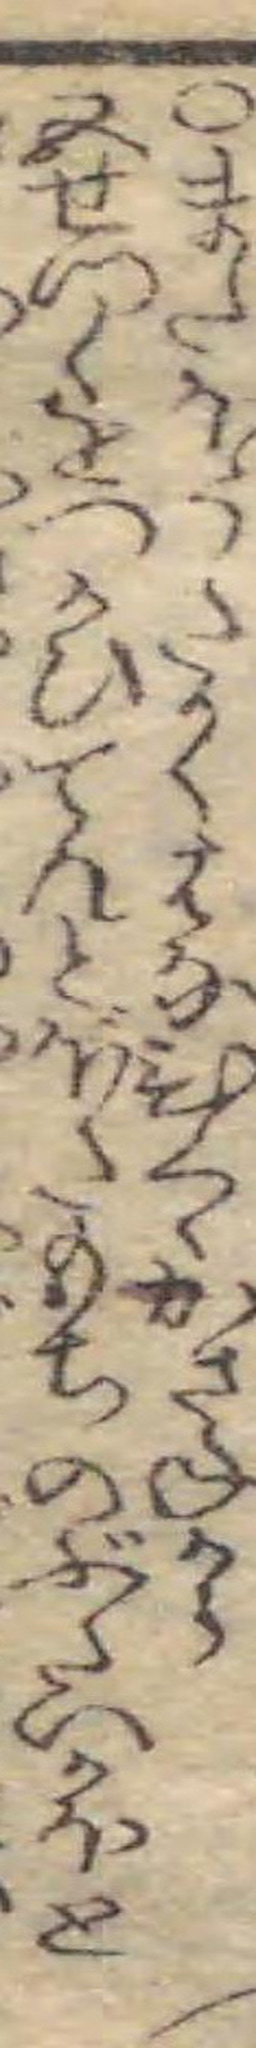五せつくをつかひてんとぼたもちのぶたいかほと
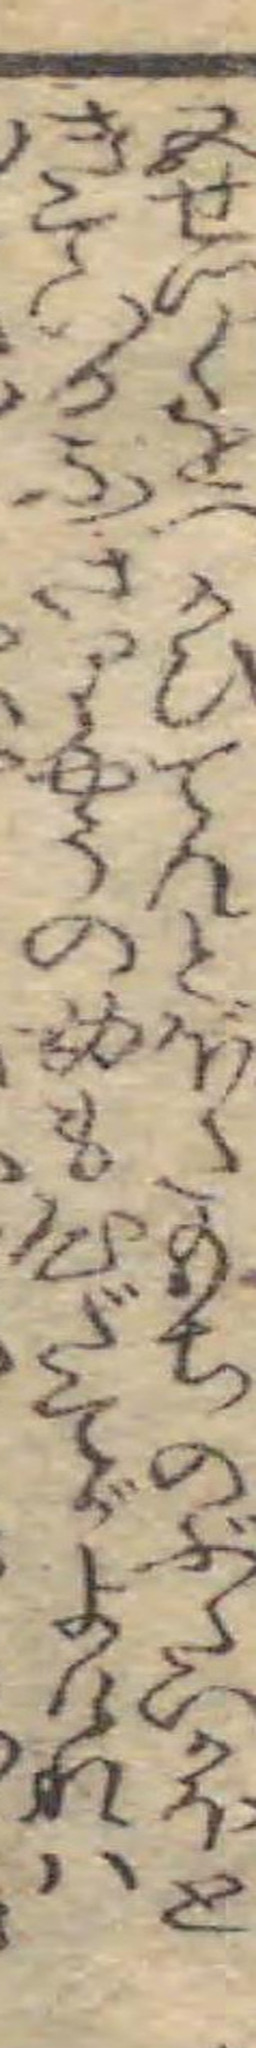きているふきりやうの女も心だてがよけれは
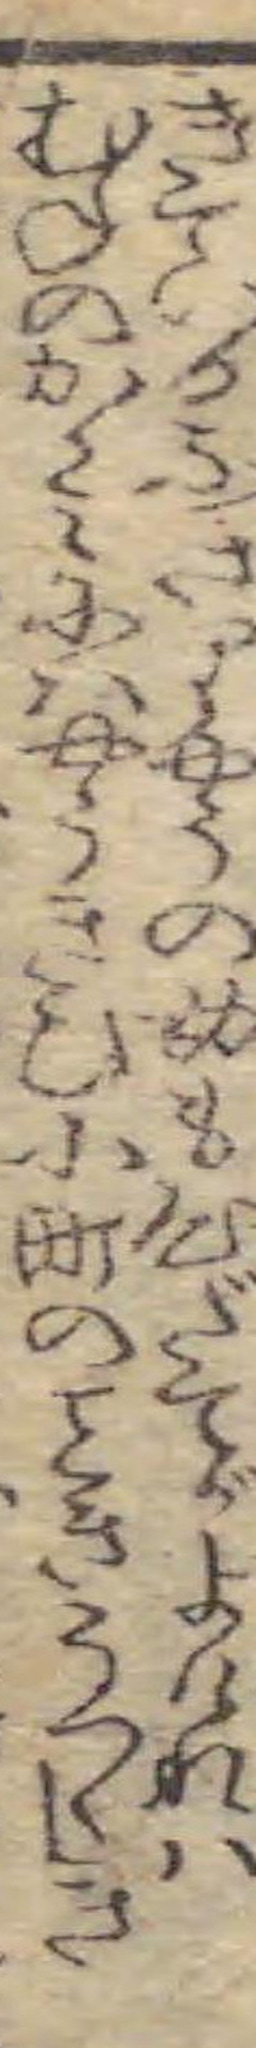むねのかゝみにはやうきひ小町のごときうつくしき
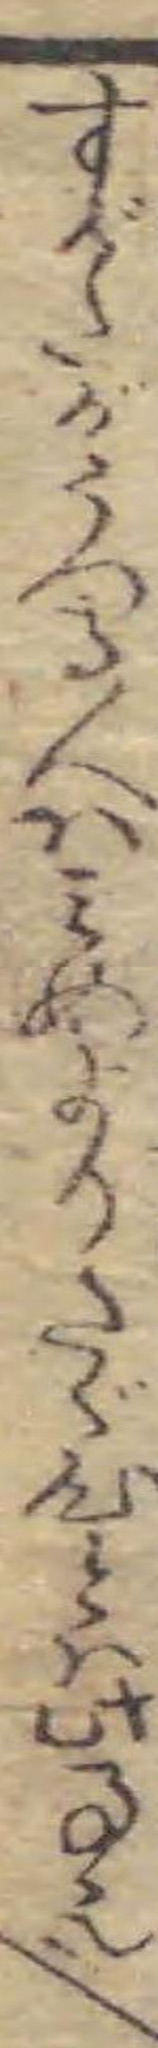すがたがうつる人はみめよりたゞ心とは此事也
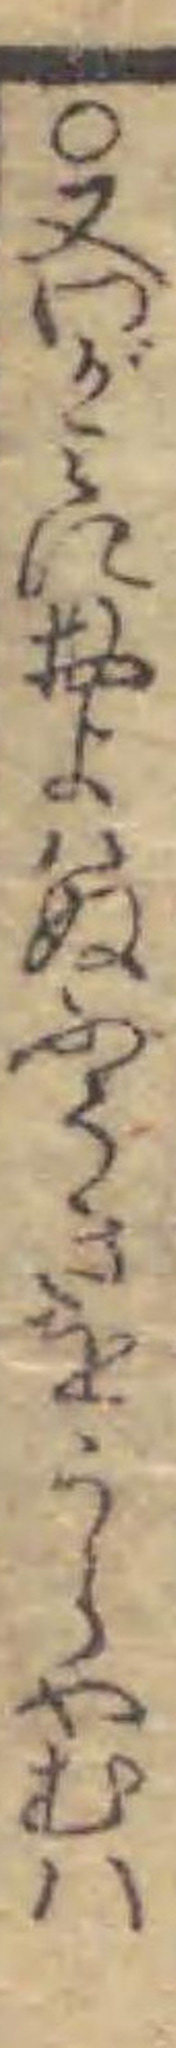○又わがみにおよはぬふうきをうらやむは
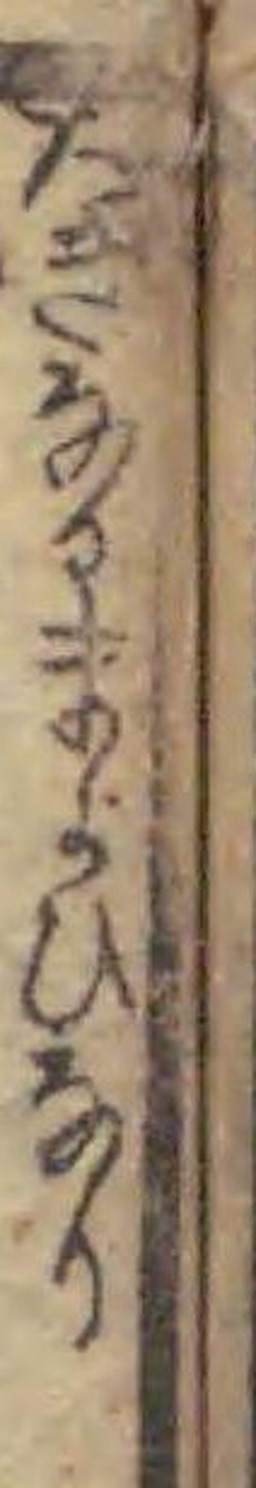大きなるまよひなり
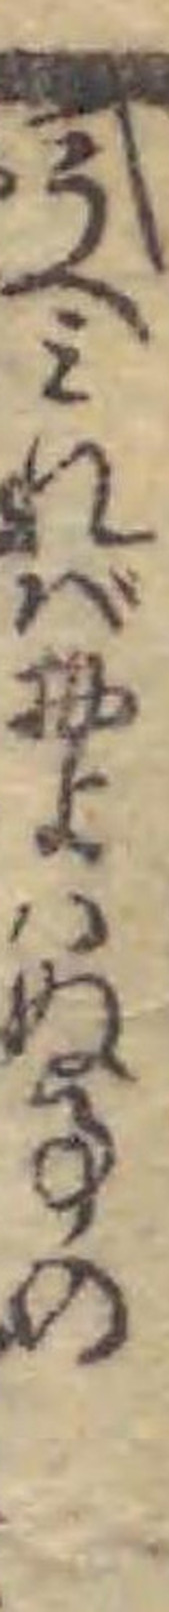〽うへみればおよはぬ事の
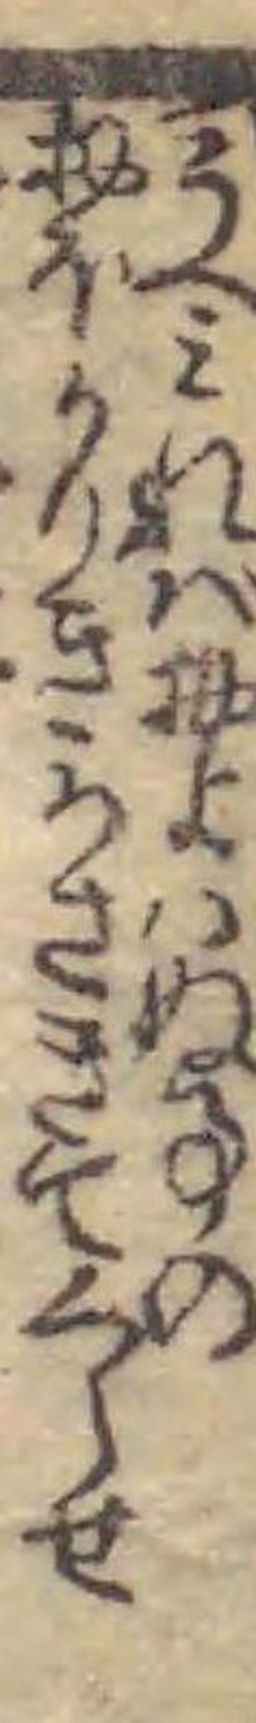おほかりきかさきてくらせ
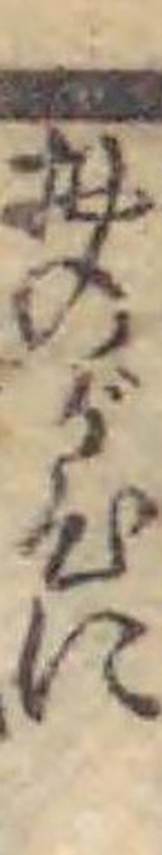おのが心に
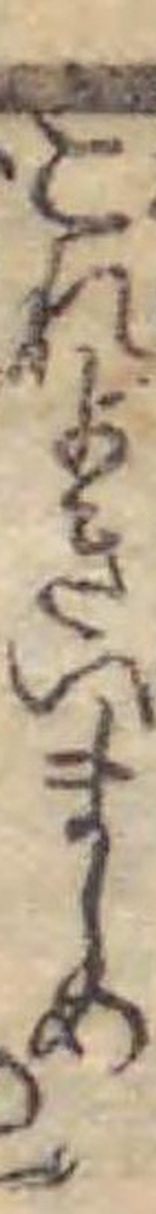これよきいましめ
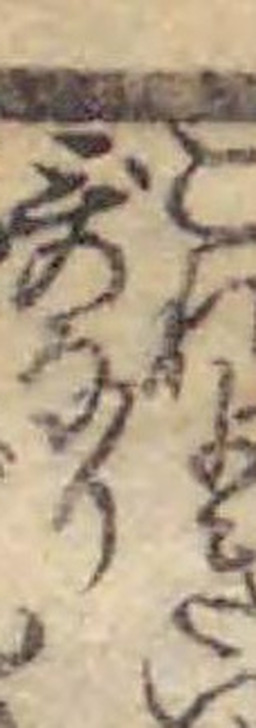哥なり
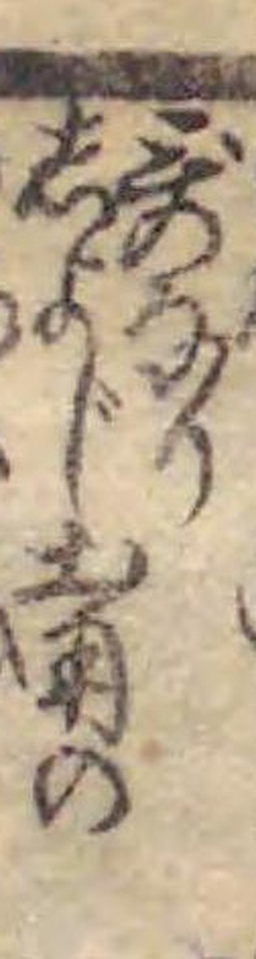しよじ土用の
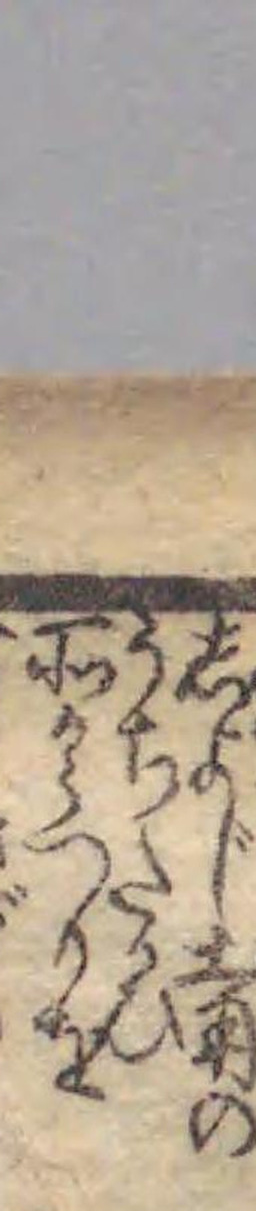所からつりを
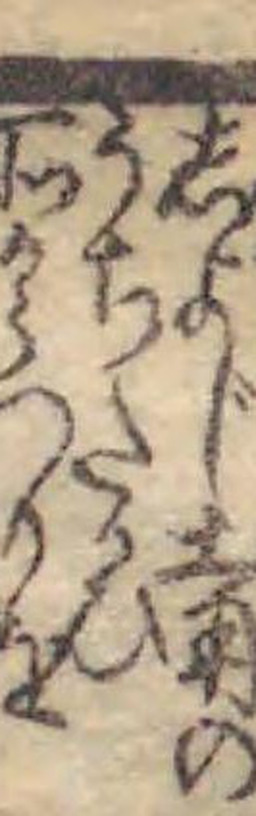うちたかひ
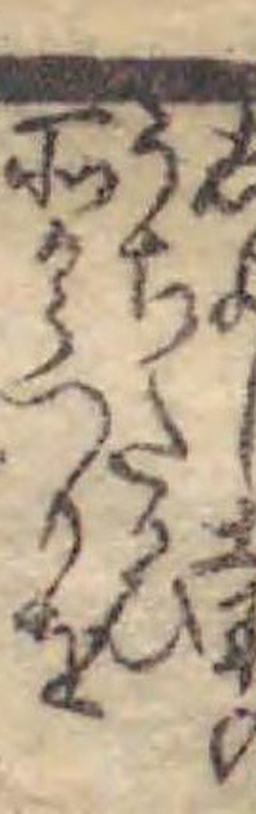所からつりを
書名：人心鏡写絵 : 3巻
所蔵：国立国会図書館 National Diet Library, JAPAN
